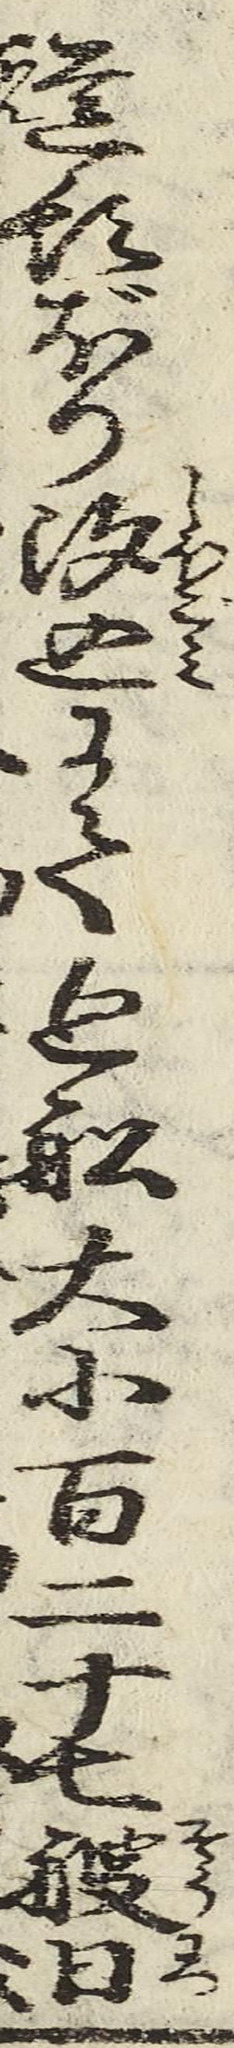道頓ぼり汐込にて廻船大小百二十七艘日
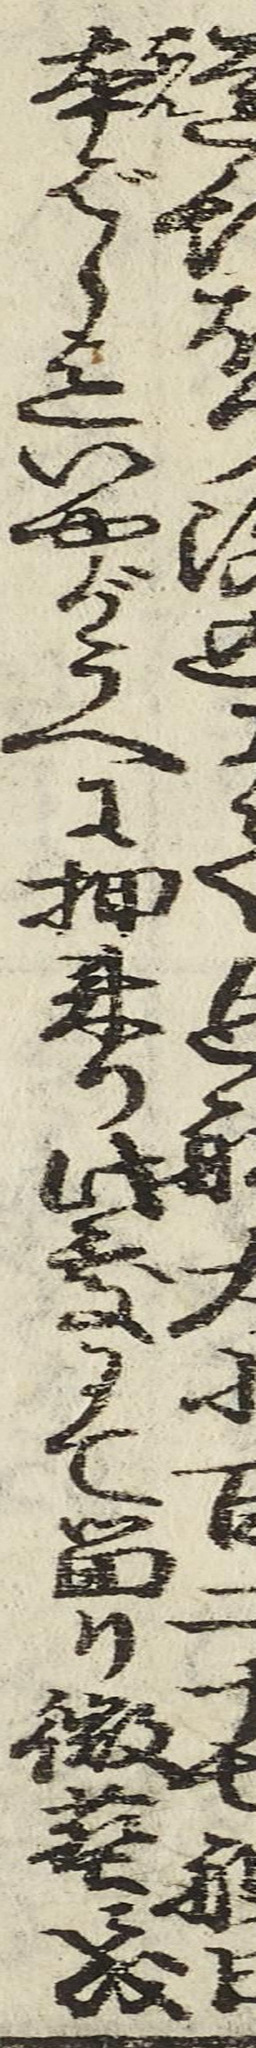本ばし迄いやがうへに押来り此処まて留り微塵ニ成
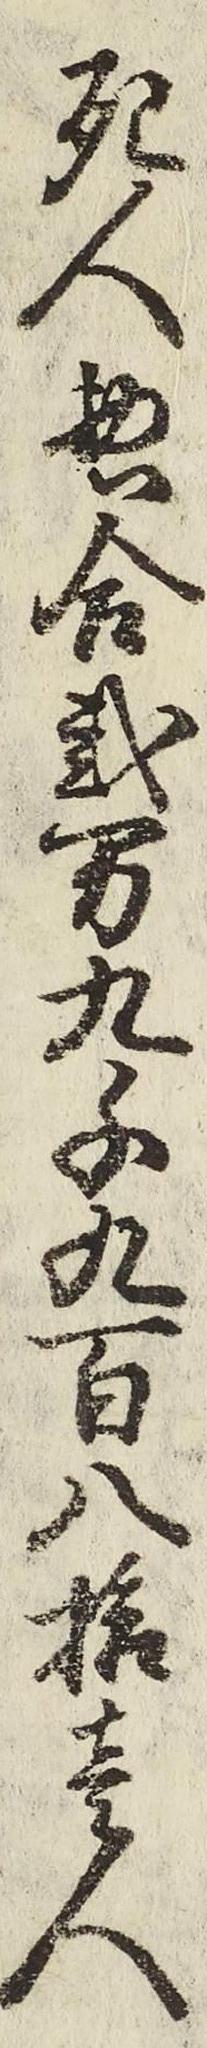死人惣合弐万九千九百八拾壱人
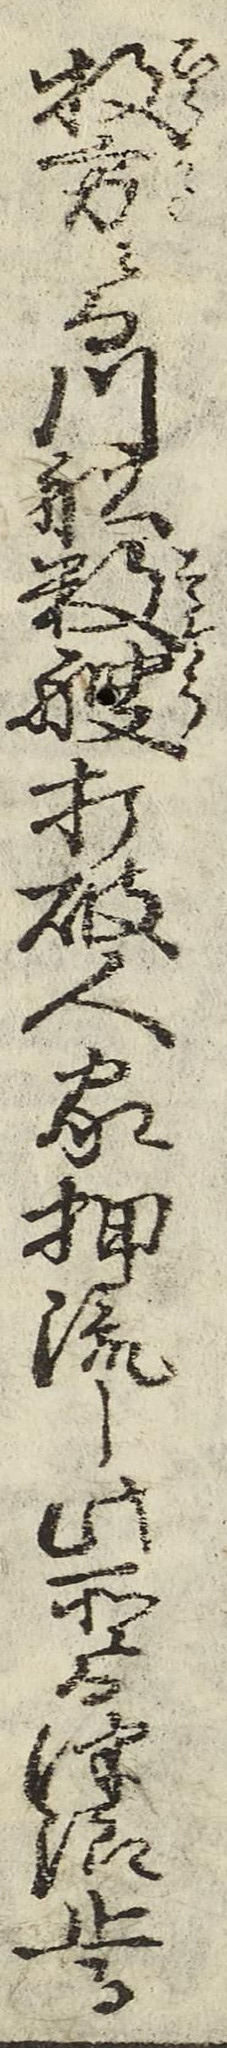枚方ニ而川船数艘打破人家押流し此所ニ而津浪止る

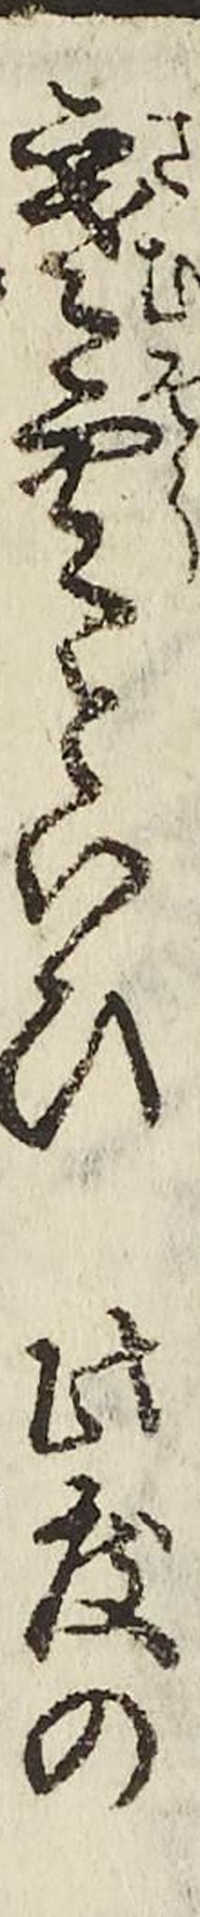寒空といひ此度の
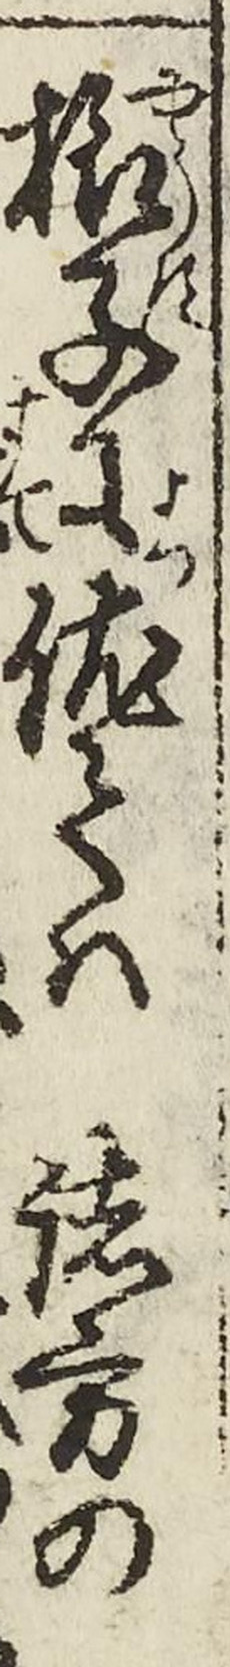様子に依ては諸方の
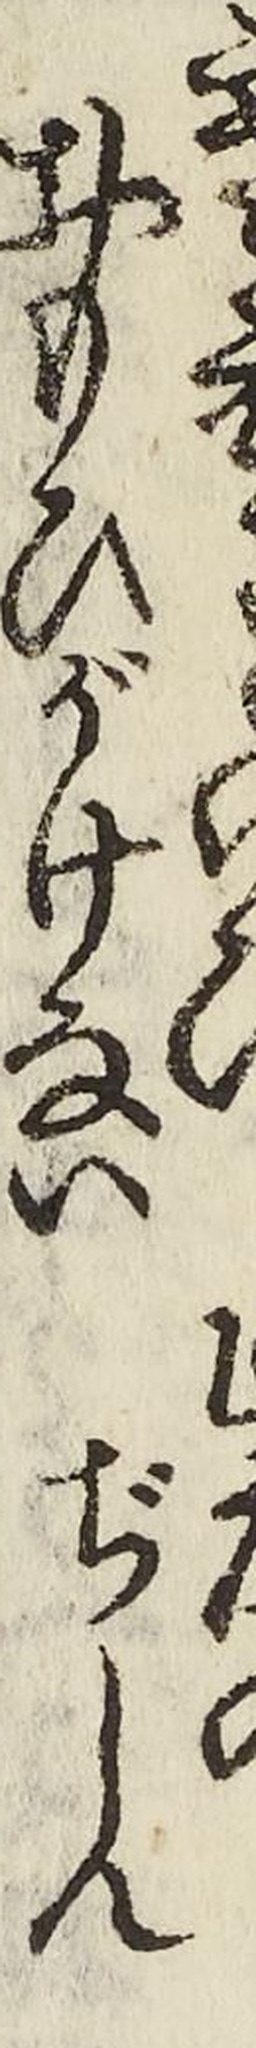おもひがけないぢしん
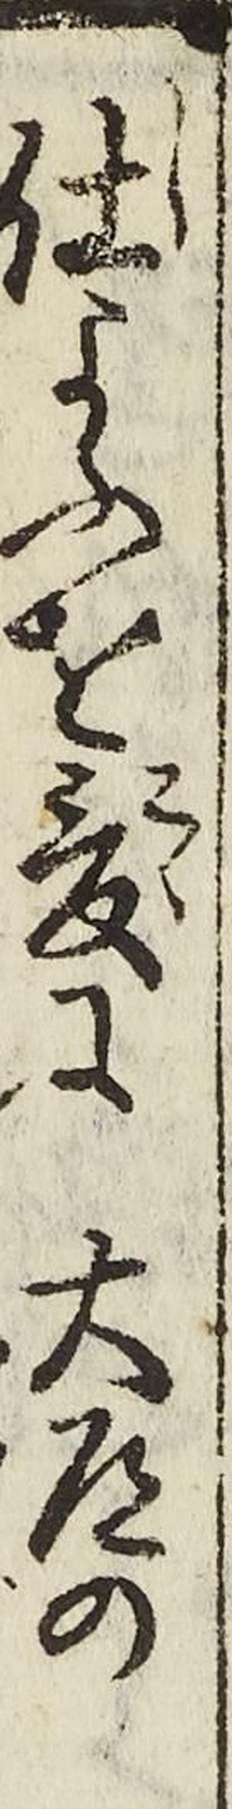仕よふを爰に大道の
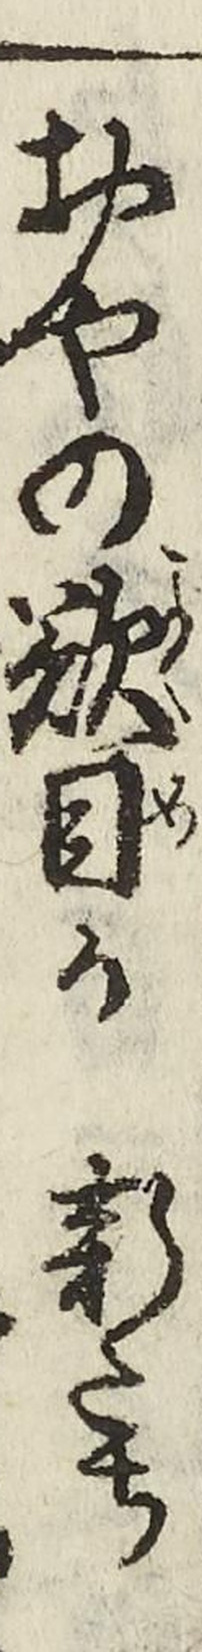おやの欲目か新たち
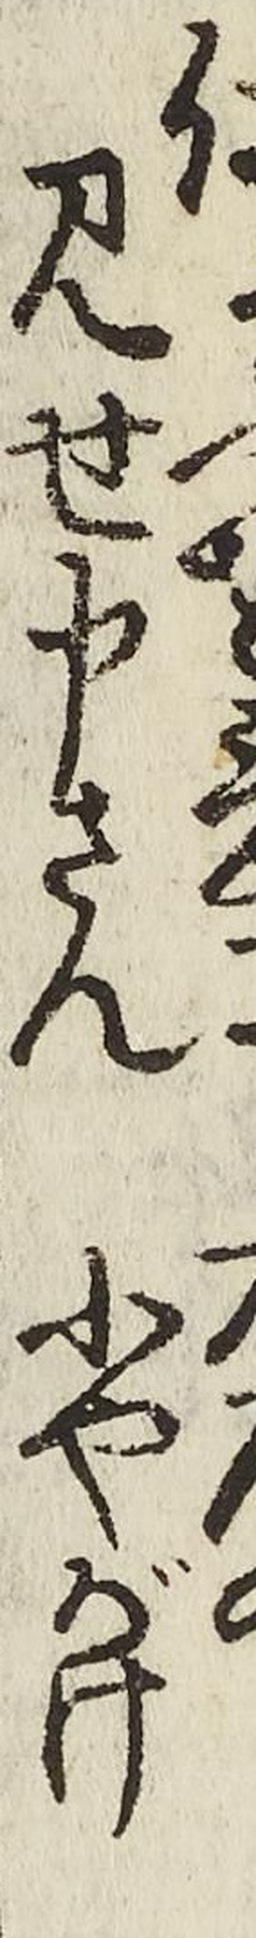見せ申さん小やがけ
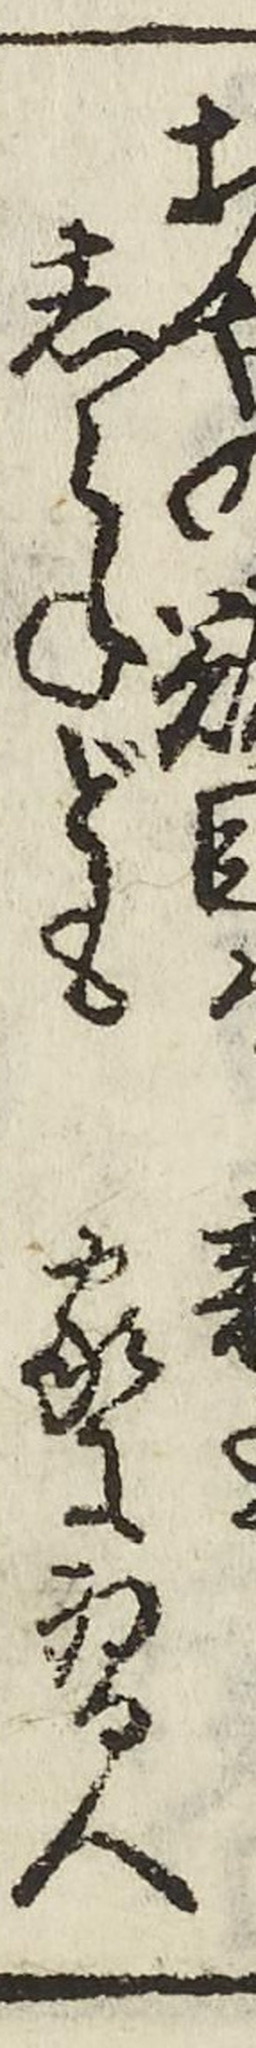しらねども家にゐる人
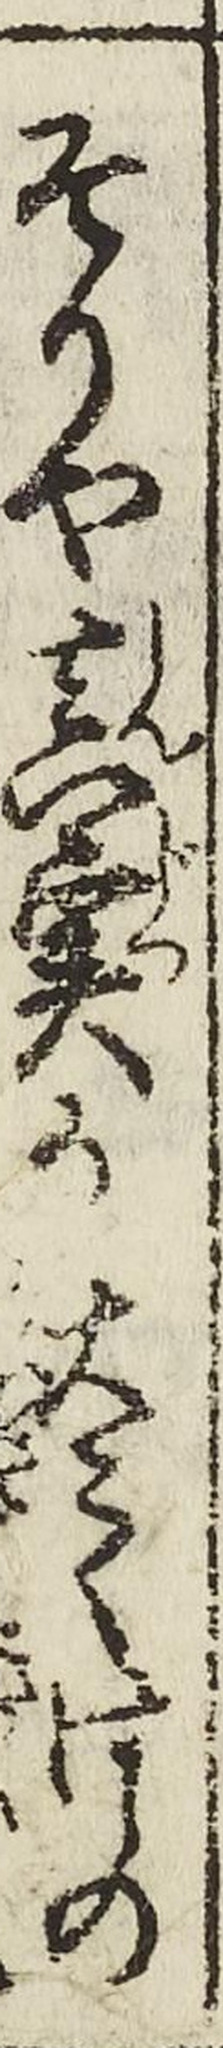そりや真実か大こくはしの
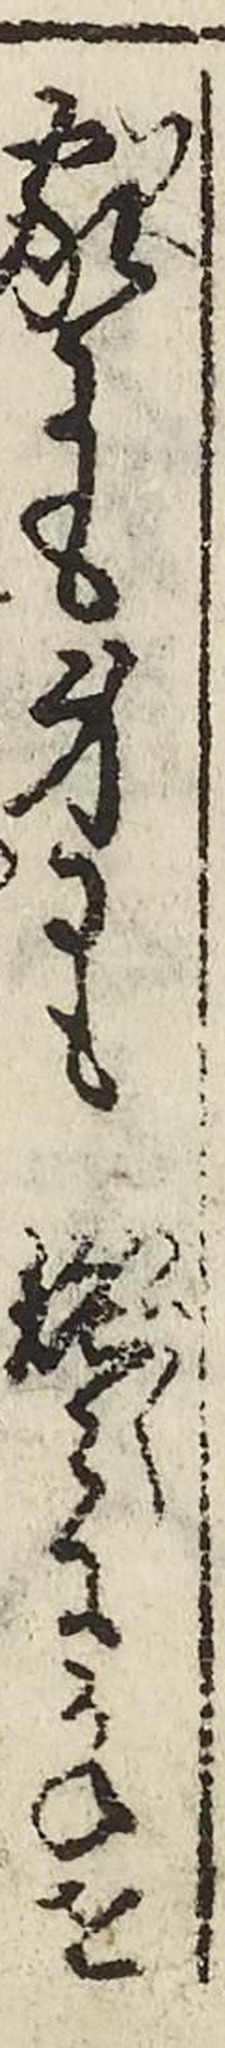家にも身にも銘々にかねを
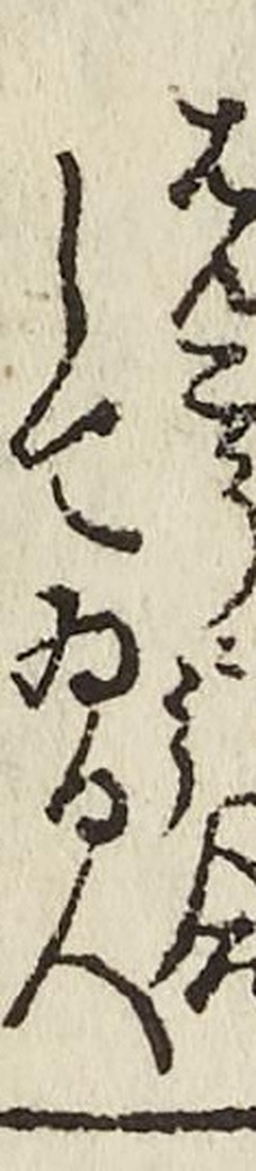してゐる人
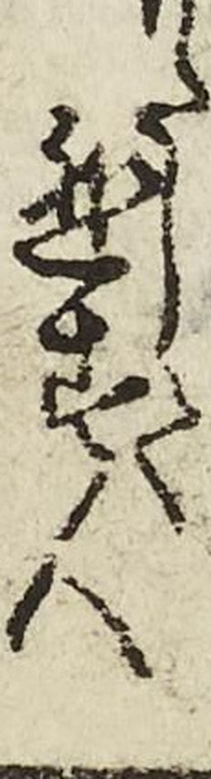逃す人
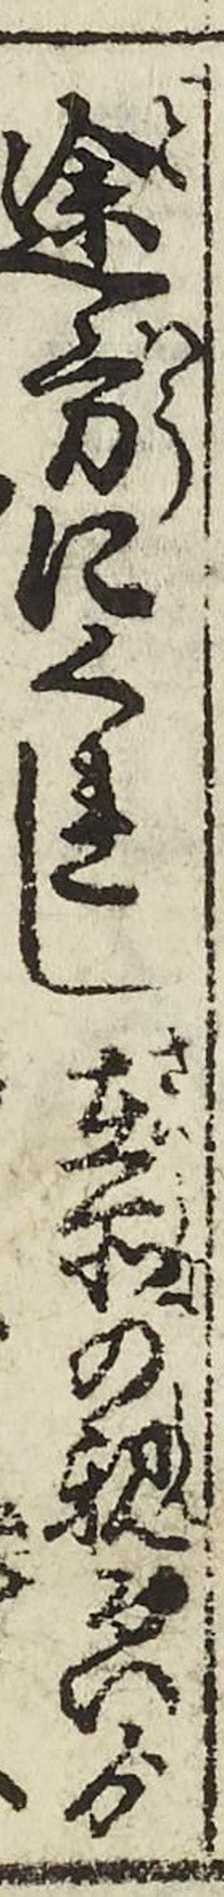途方にくれし在所の親るいゟ
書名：地震津浪末代噺の種　全
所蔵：東京大学地震研究所図書室 Earthquake Research Institute Library, The University of Tokyo, JAPAN
